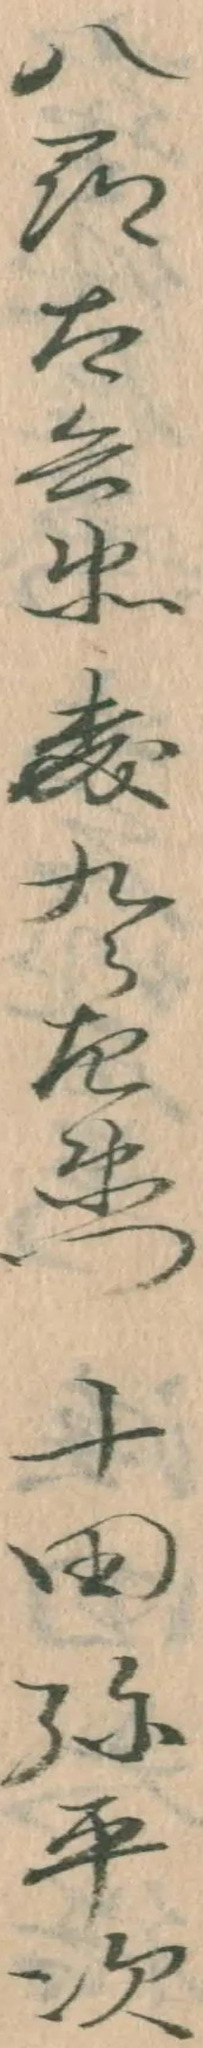八尋太兵衛森九郎左衛門十田弥平次
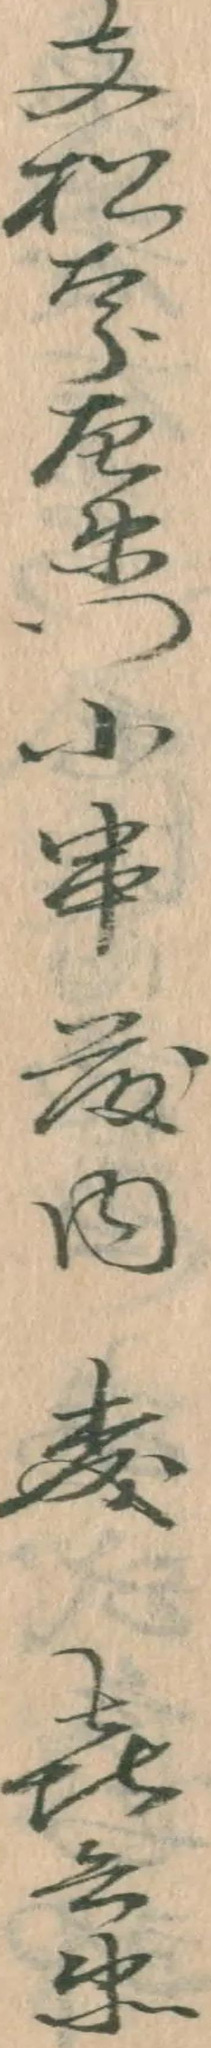支松太郎左衛門小串藤内森喜兵衛
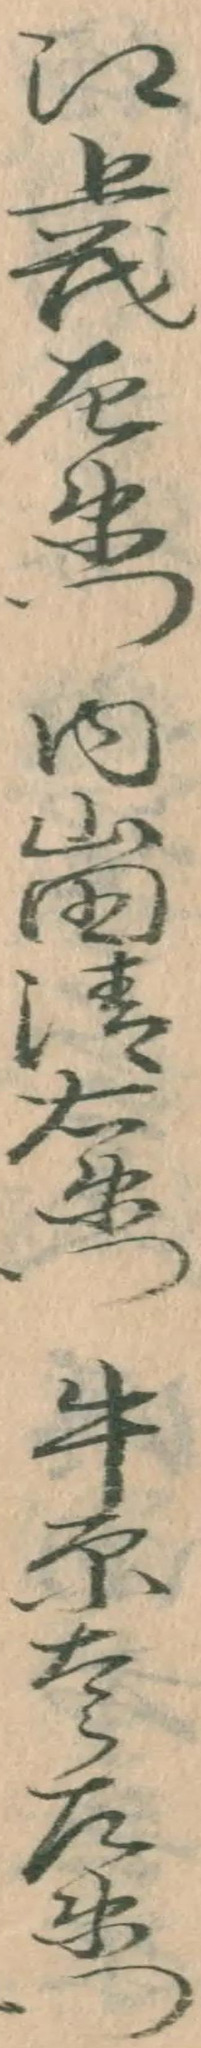江上茂左衛門内山田清右衛門牛原太郎左衛門
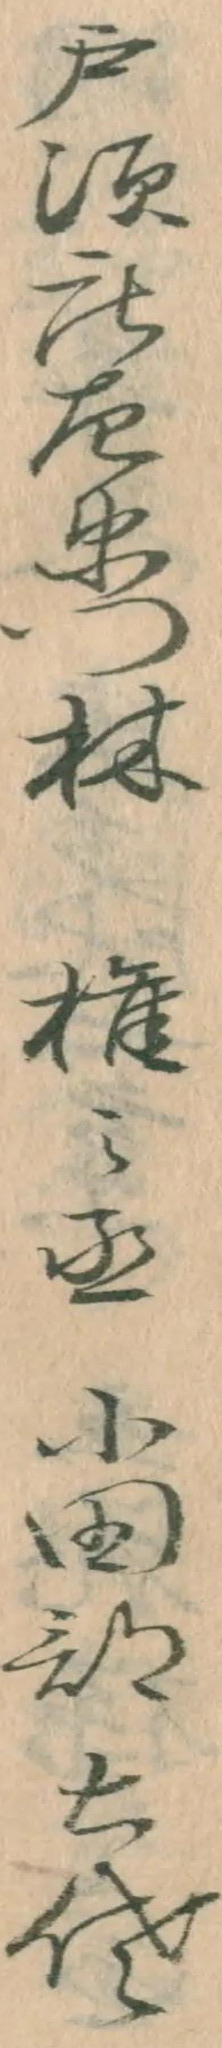戸須庄左衛門林権之丞小田部土佐

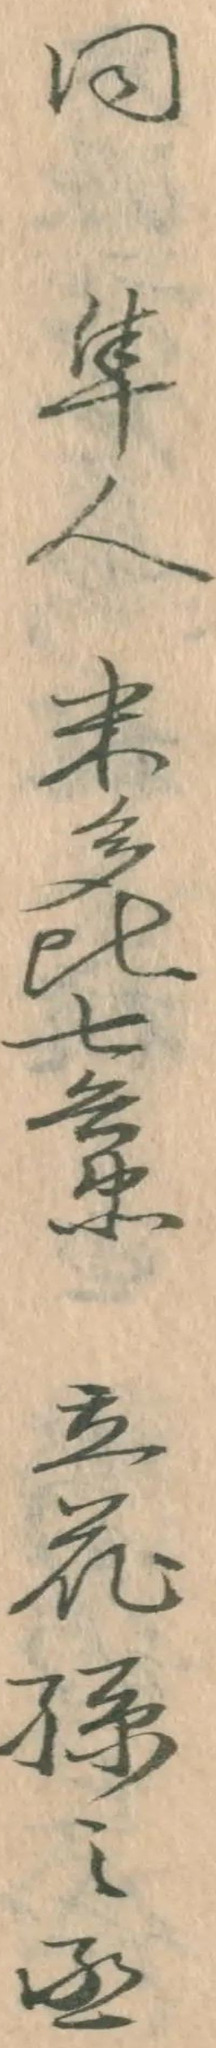同隼人米多比七兵衛立花孫之丞
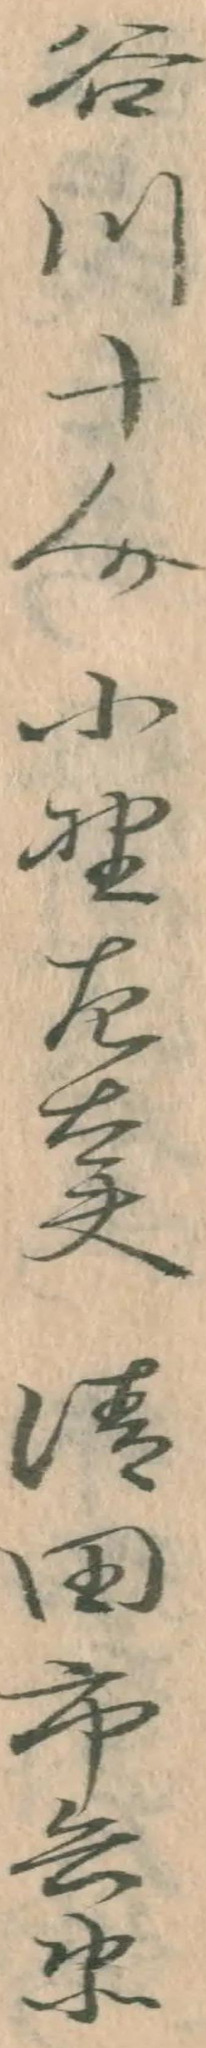谷川十介小野左太夫清田市兵衛
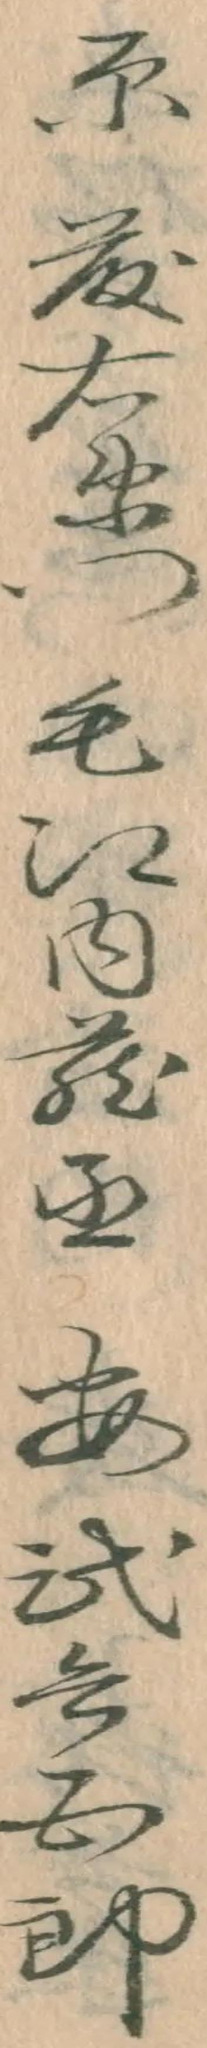原藤右衛門毛江内蔵丞安武兵五郎
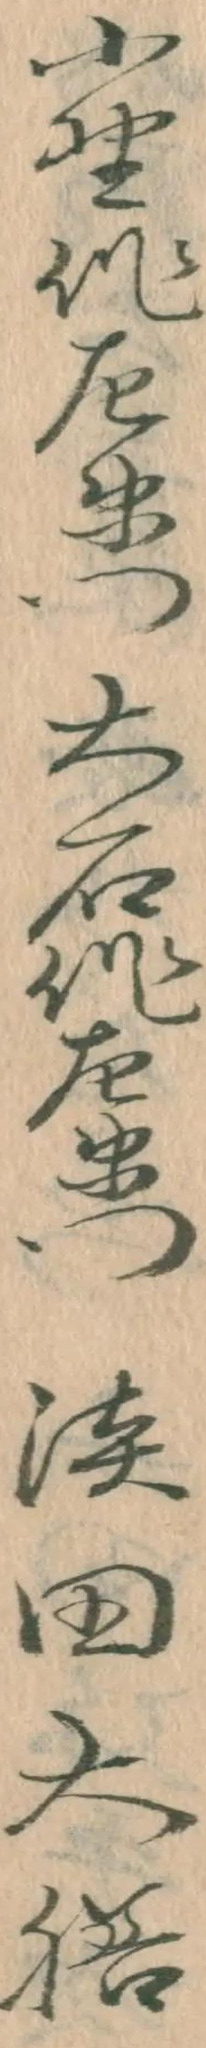小野作左衛門大石作左衛門談田大膳
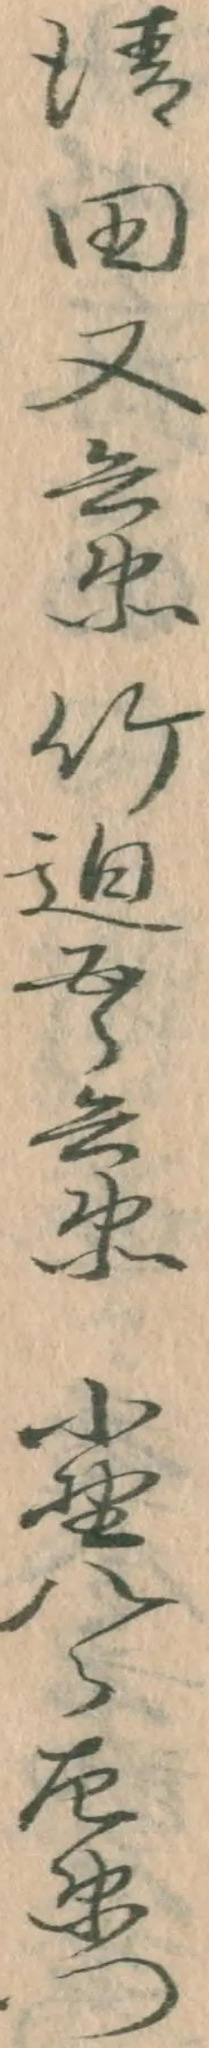清田又兵衛竹迫五郎兵衛小野八郎左衛門
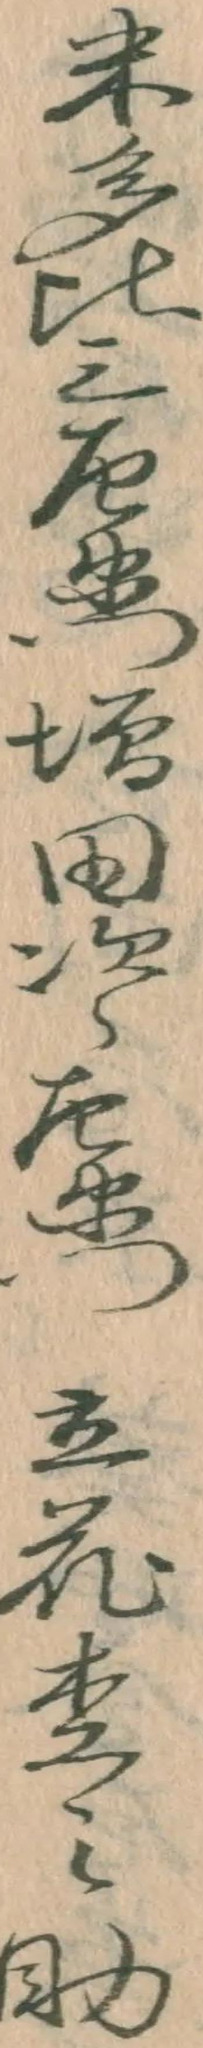米多比三左衛門増田次郎左衛門立花杢之助
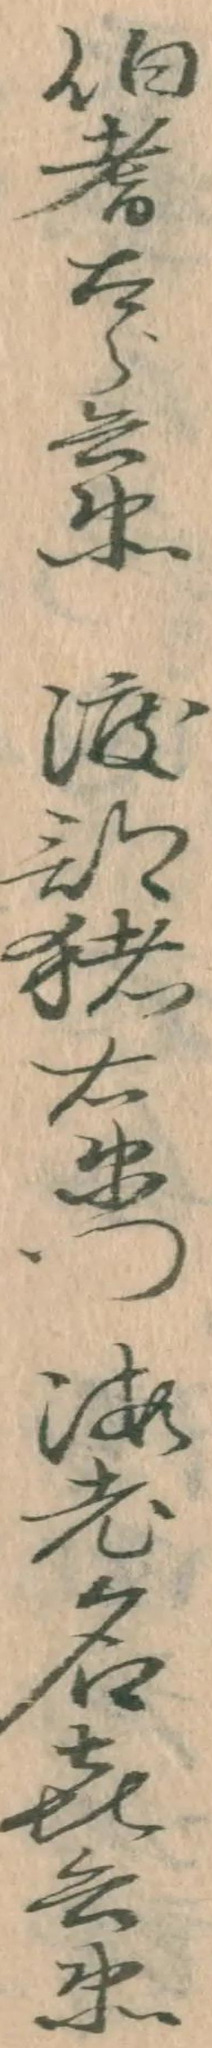伯耆太郎兵衛渡部猪右衛門海老名喜兵衛
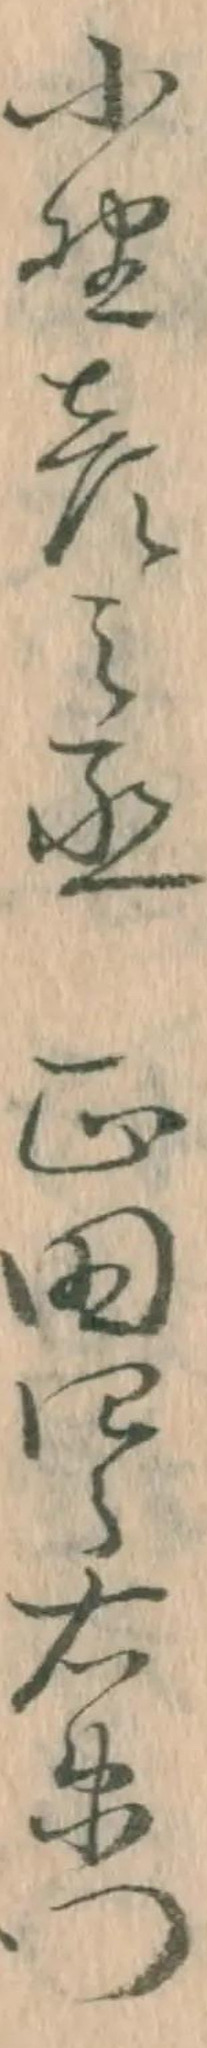小野彦之丞正田四郎右衛門
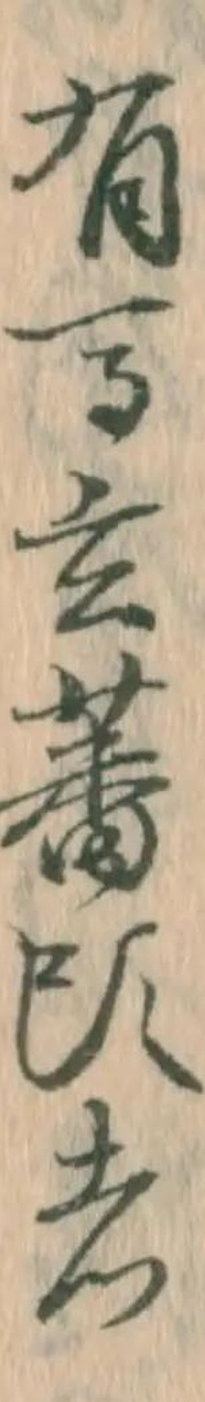有馬玄蕃頭者
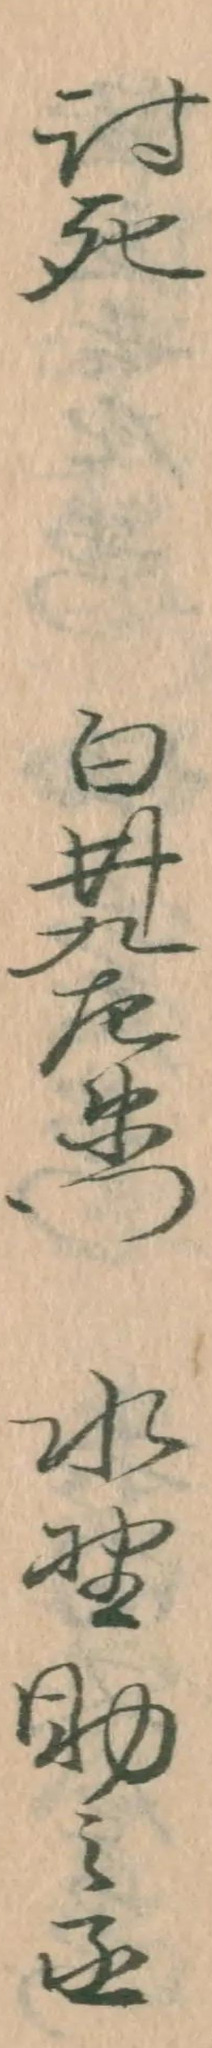討死白井九左衛門水野助之丞
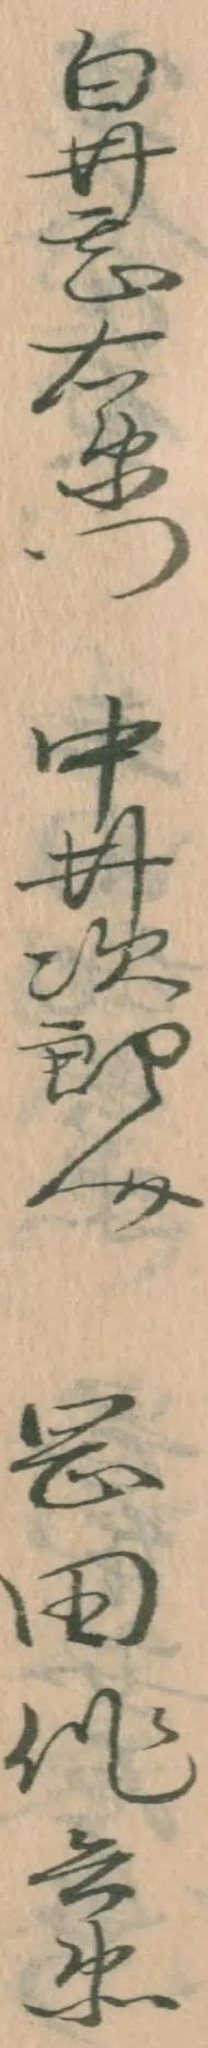白井甚右衛門中井次郎介岡田作兵衛
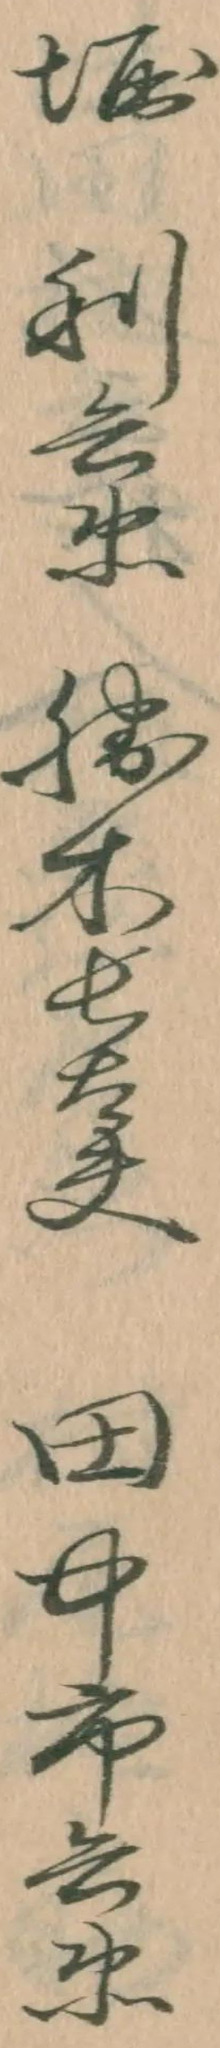堀利兵衛勝木七太夫田中市兵衛
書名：切支丹御退治記 49巻. [9]
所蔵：国立国会図書館 National Diet Library, JAPAN
